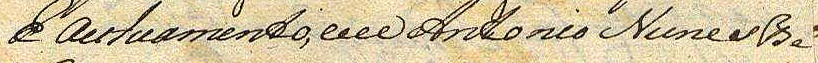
E autuamento, e eu Antonio Nunes Be
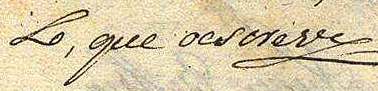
Lo, que o escrevy
